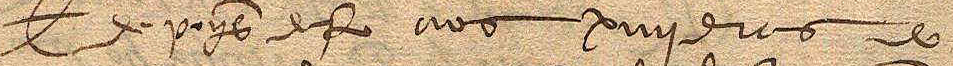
E depoys desto aos xiiij dias do
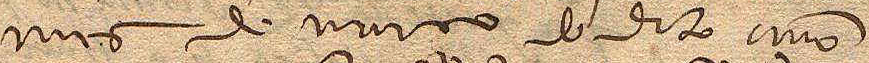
mes de março do dito an̄o
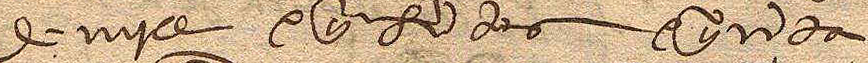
de mjll e q̄nhētos e q̄orēta
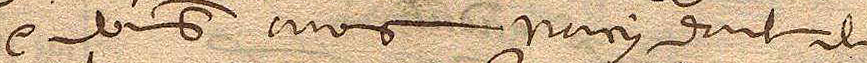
e dous anos na cydade de
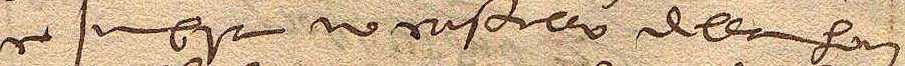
coJmbra no castello della hon
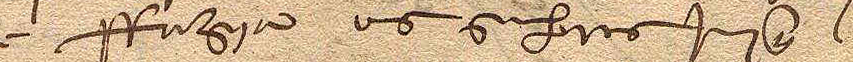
de ffazyā os senhores Imq̄
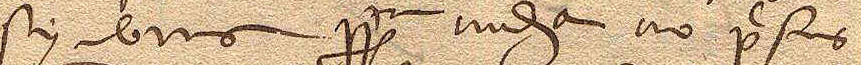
sydores ꝓpca audja ao p̄sos
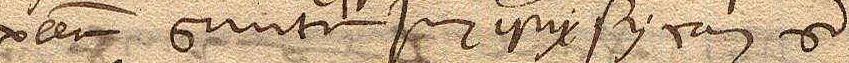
pll̄a santa Jmquysyçam sē
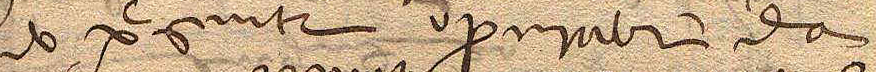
do p̄semte o ꝓcurador da
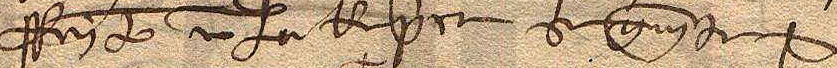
ffeyto c̄o ha Rep̄ica segūjte
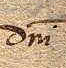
dn̄i
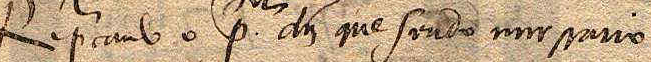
Rep̄cando o ptor. diz que sendo necessario
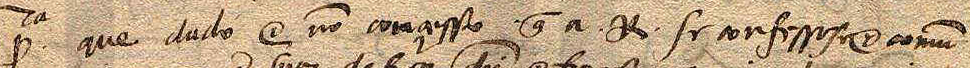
p.ra que dado e nō comçesso q̄ a Re se confessase e comū
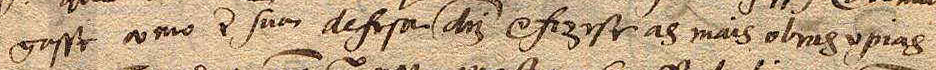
gasse como ē sua defesa diz̄ e fizese as mais obras o pias
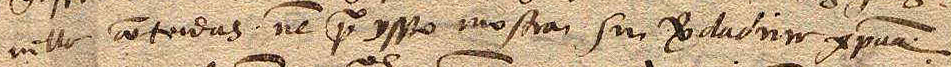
nella c̄oteudas n̄e p̄o ysso mostra ser ꝟdadeira xpāa
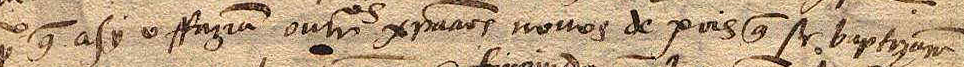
p̄oq̄ asy o ffazīa outros xpãaos nouos depois q̄ se baptizāra
